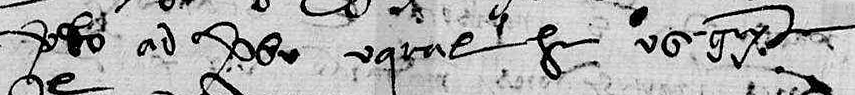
ꝟbo ad ꝟbo o qual he o seguȳte
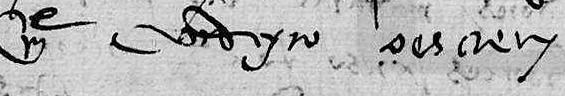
mel Cordeyro o escreuj
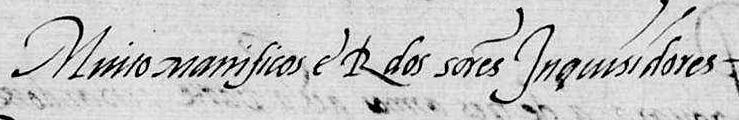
Muito Manificos e Rdos sorēs Jnquisidores
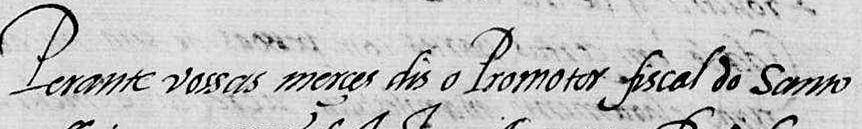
Perante vossas merces diz o Promotor fiscal do Santo
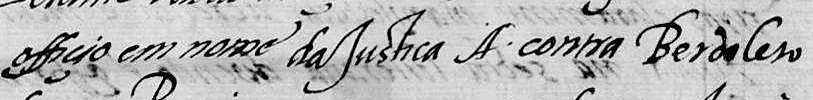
officio em nome da Justiça A. contra Berdoleto
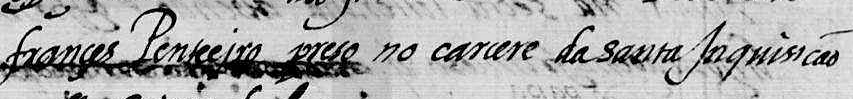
frances Penteeiro preso no carcere da santa Jnquisiçaõ
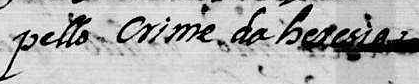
pello crime da heresia
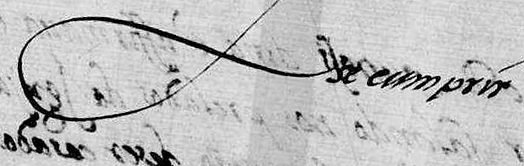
E se cumprir
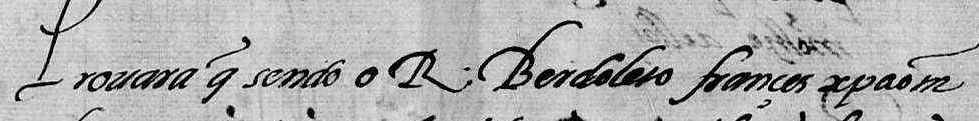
Prouara q̅ sendo o R. Berdoleto frances xpaõm
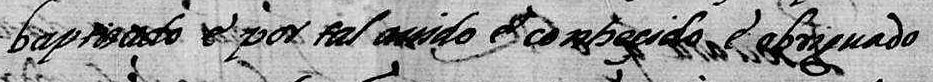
baptizado e por tal auido e conhecido e obriguado
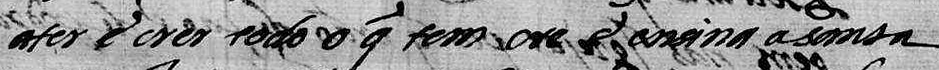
a ter e crer todo o q̄ tem cre e ensina a santa
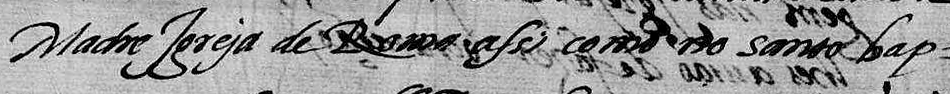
Madre Jgreja de Roma assi como no santo bap
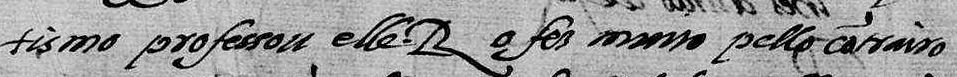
tismo professou elle .R o fez muito pello cōtrairo
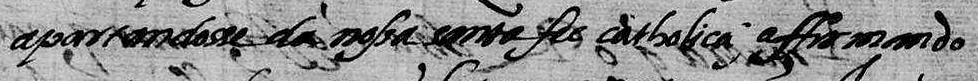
apartandosse da nossa santa fee catholica affirmando
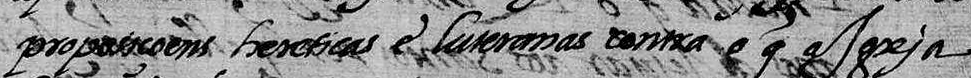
proposiçoens hereticas e luteranas contra o q̄ a Jgreja
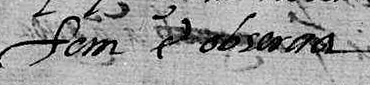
tem e obserua
